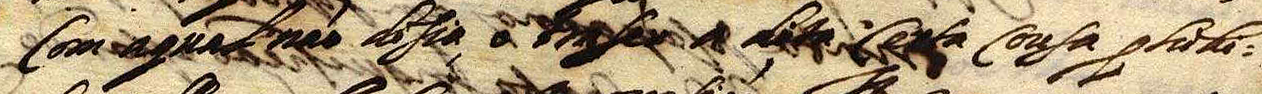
Com a qual naõ disia, o traser a dita Certa Cousa ꝓhibi
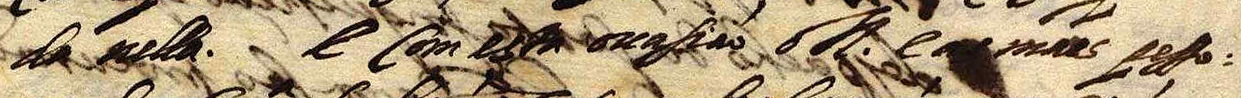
da nella. E Com esta occasiaõ o R. e as maes pesso
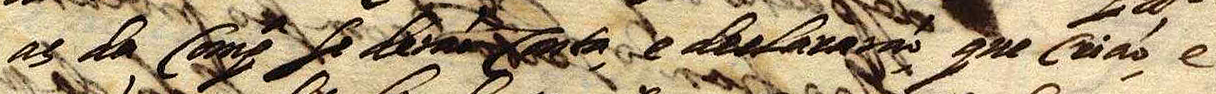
as da Compa se deraõ Conta, e declararaõ, que criaõ, e
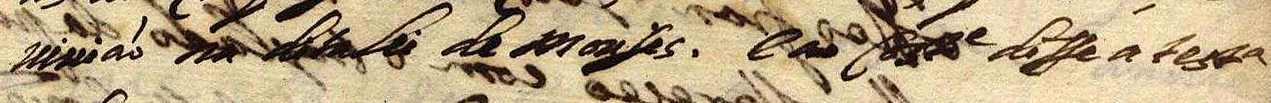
uiuiaõ na dita lei de mouses. e ao Coste disse a testa
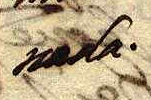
nada.
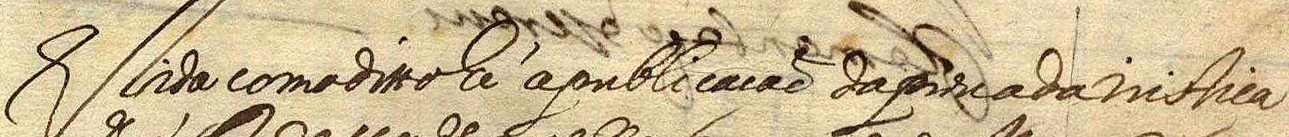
E lida como ditto hé a publicaçaõ da proua da iustiça
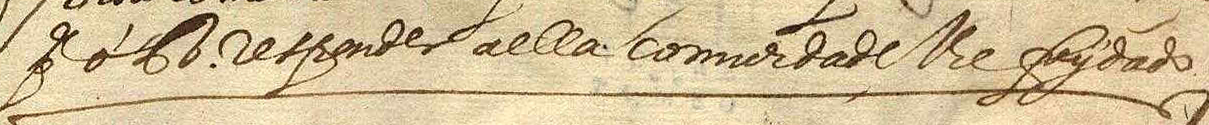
pa o R. responder a ella com uerdade, lhe foy dado
